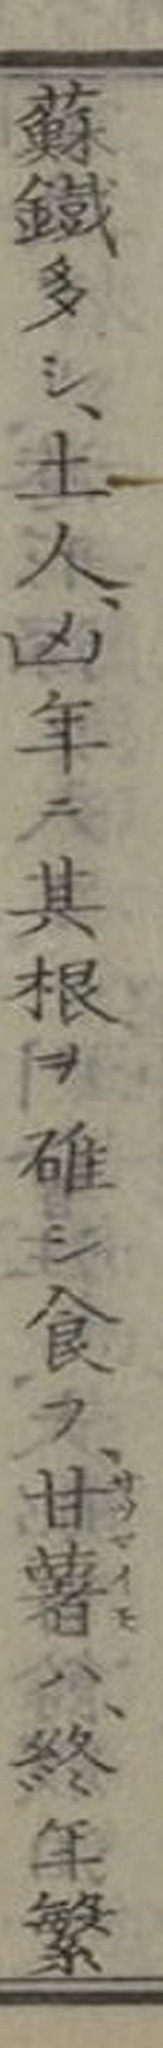蘇鉄多シ、土人、凶年ニ其根ヲ碓シ食フ、甘薯ハ、終年繁
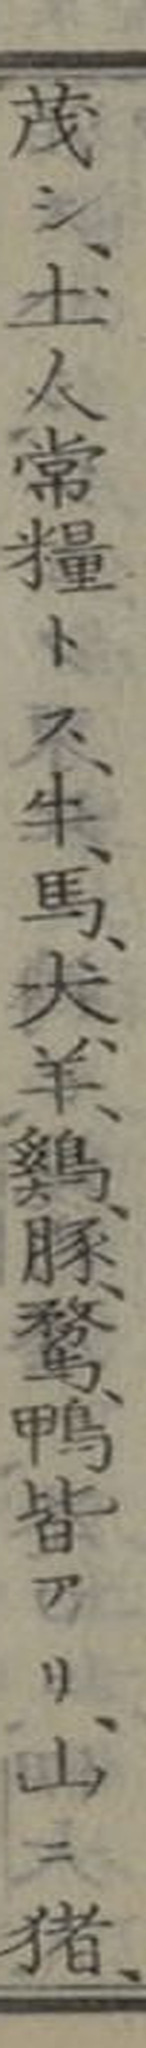茂シ、土人常糧トス、牛、馬、犬、羊、鶏、豚、騖、鴨皆アリ、山ニ猪、
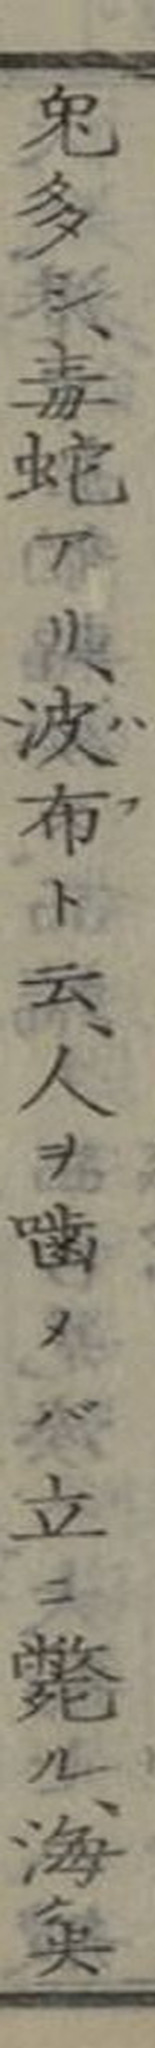兎多シ、毒蛇アリ、波布ト云、人ヲ嚙メバ立ニ斃ル、海魚
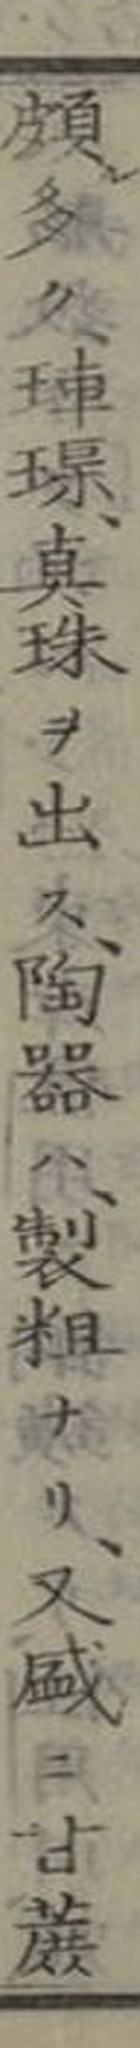頗多ク、、真珠ヲ出ス、陶器ハ、製粗ナリ、又盛ニ甘蔗
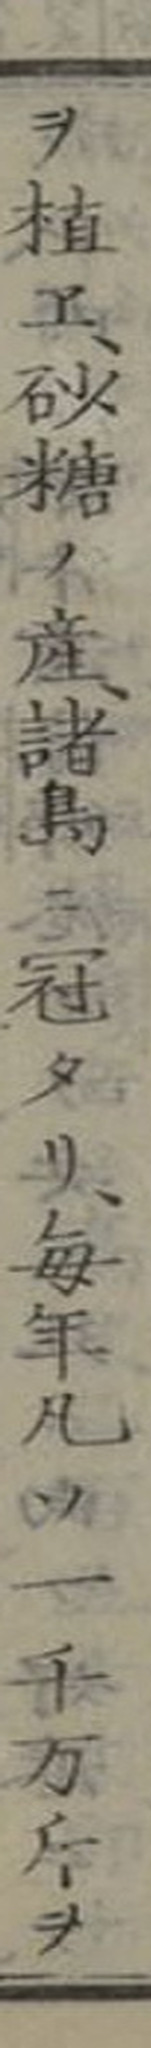ヲ植ヱ、砂糖ノ産、諸島ニ冠タリ、毎年凡ソ一千万斤ヲ
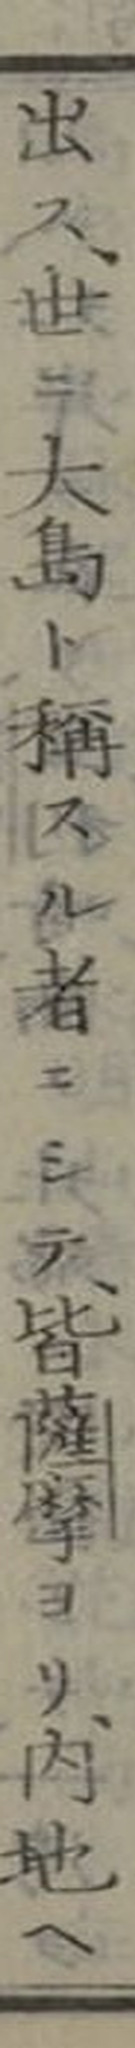出ス、世ニ大島ト称スル者ニシテ、皆薩摩ヨリ、内地ヘ
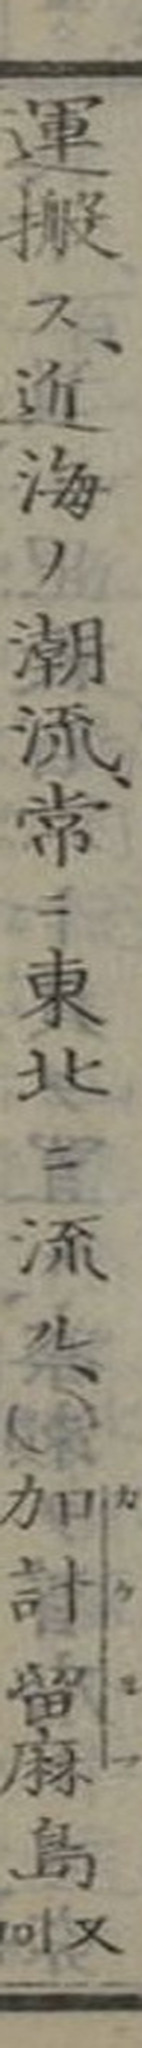運搬ス、近海ノ潮流、常ニ東北ニ流ル、○加計留麻島又加
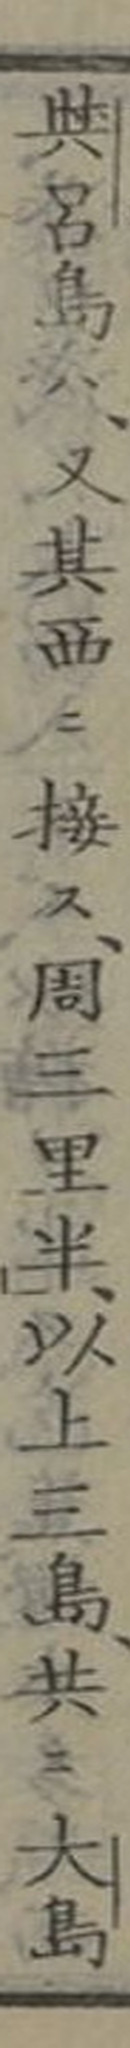与呂島ハ、又其西ニ接ス、周三里半、」以上三島、共ニ大島
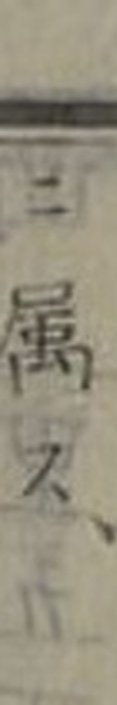ニ属ス、
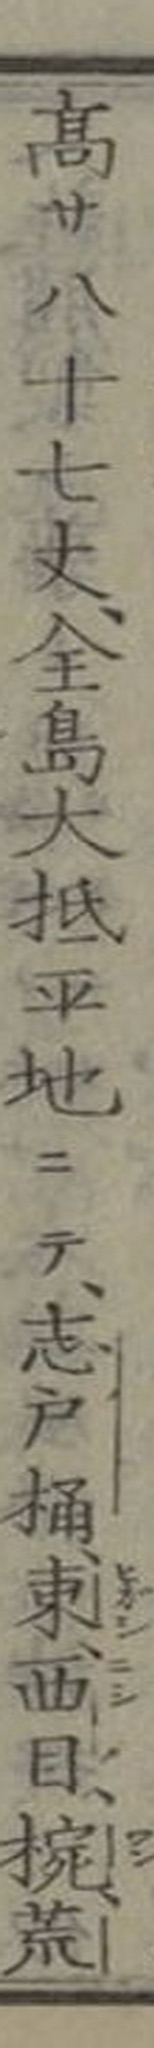高サ八十七丈、全島大抵平地ニテ、志戸桶、東、西目、椀、荒
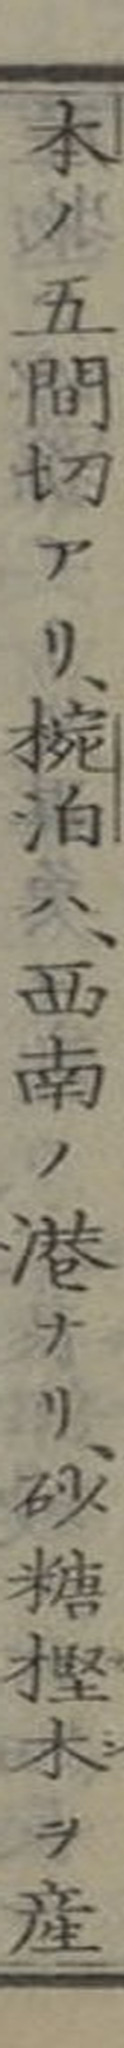本ノ五間切アリ、椀泊ハ、西南ノ港ナリ、砂糖樫木ヲ産
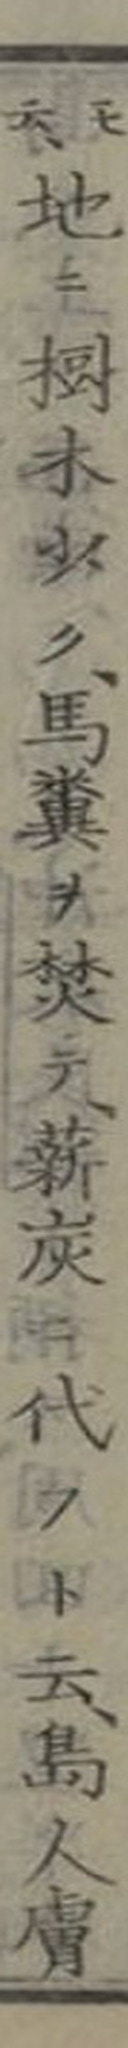モ云、地ニ樹木少ク、馬糞ヲ焚テ、薪炭ニ代フト云、島人膚
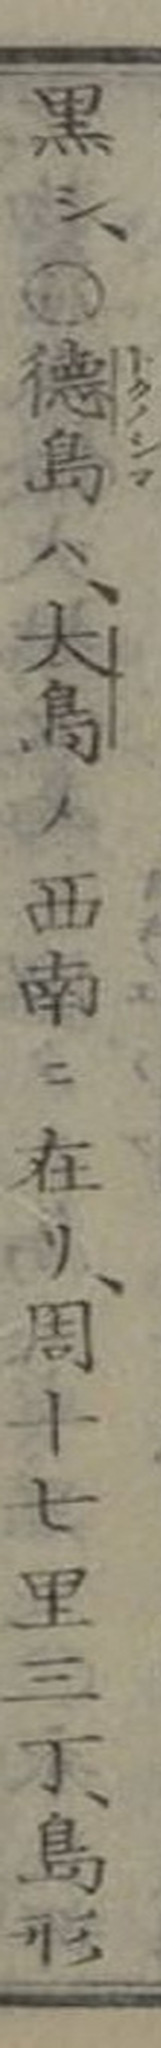黒シ、○徳島ハ、大島ノ西南ニ在リ、周十七里三丁、島形
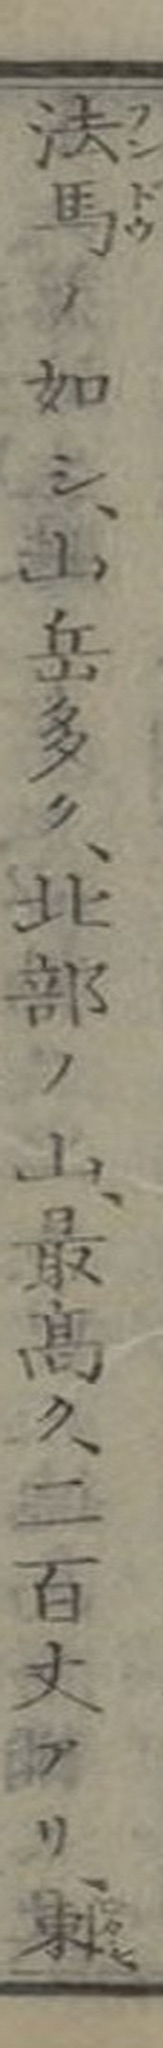法馬ノ如シ、山岳多ク、北部ノ山、最高ク、二百丈アリ、東、
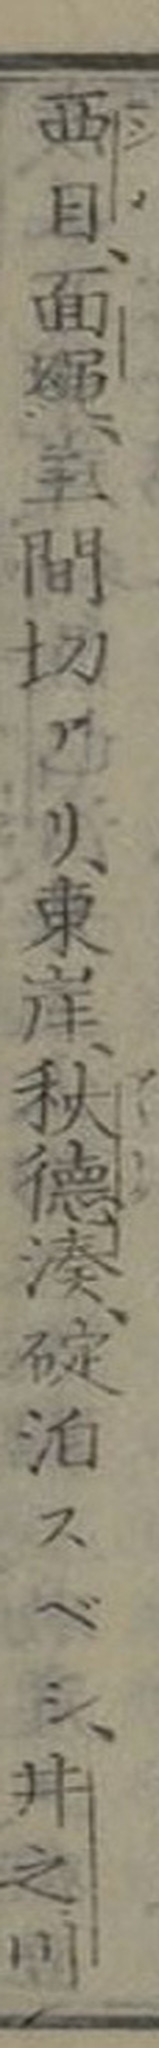西目、面縄、三間切アリ、東岸、秋徳湊、碇泊スベシ、井之川

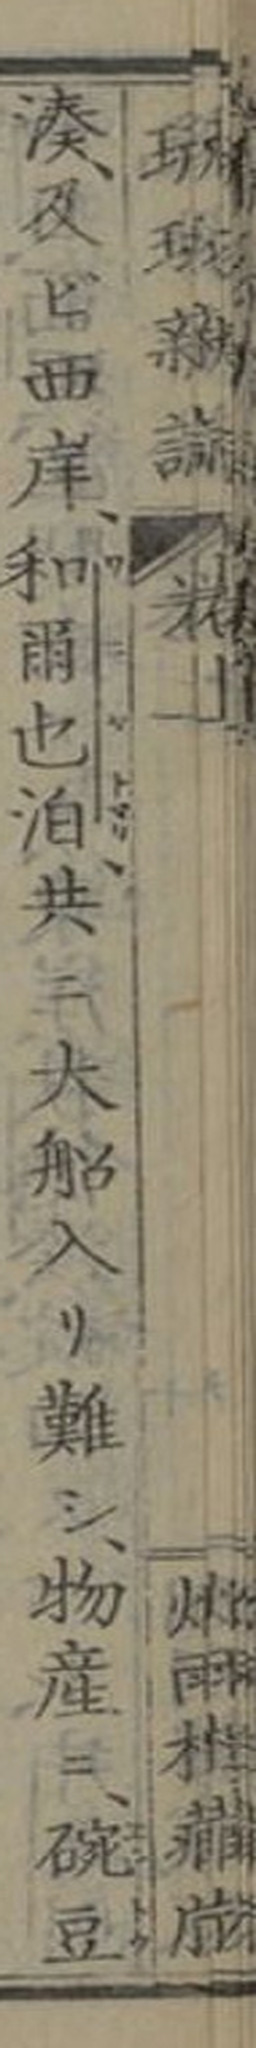湊、及ビ西岸、和爾也泊、共ニ大船入リ難シ、物産ニ、碗豆
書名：琉球新誌 図附 上
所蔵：University of the Ryukyus Library
